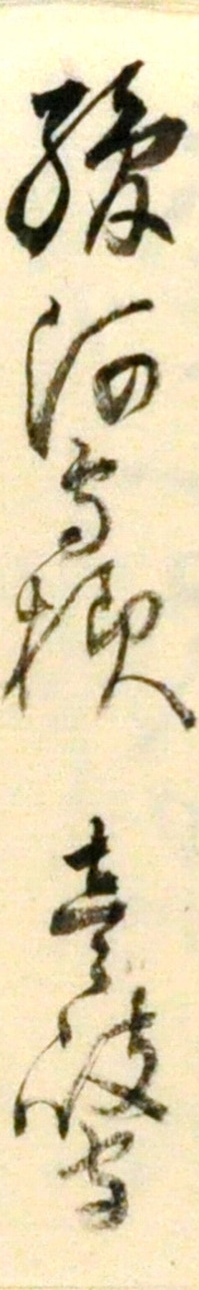駿河守様隠岐守
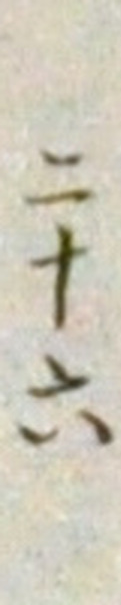二十六
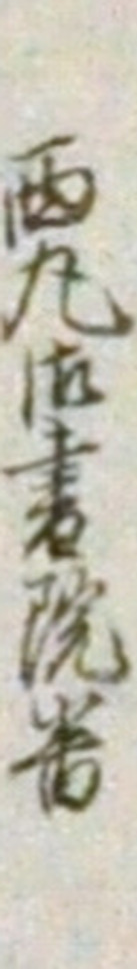西丸御書院番
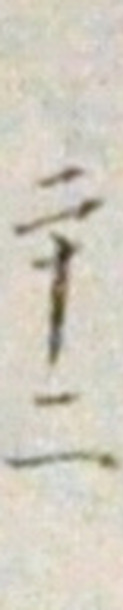二十二
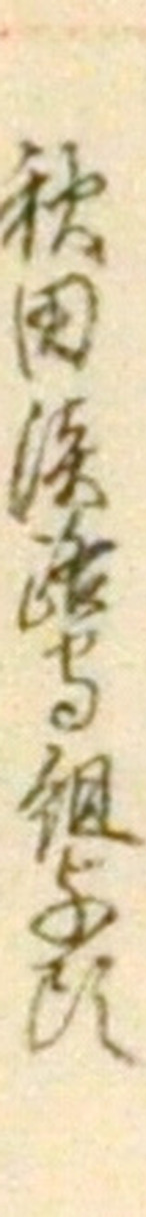秋田淡路守組与頭
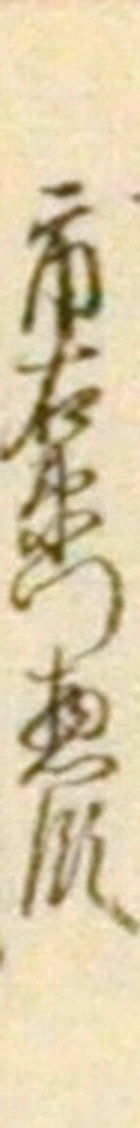市右衛門惣領
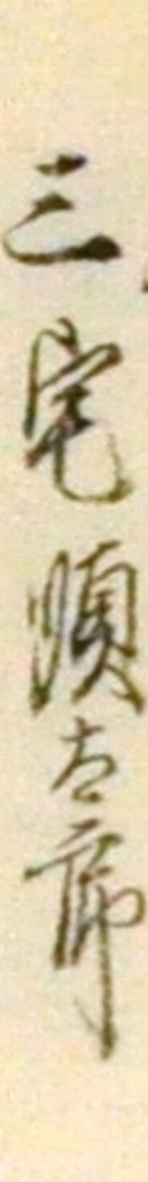三宅順太郎
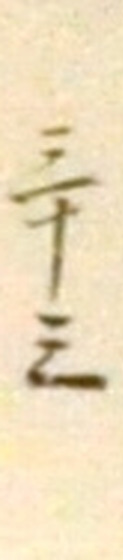三十三

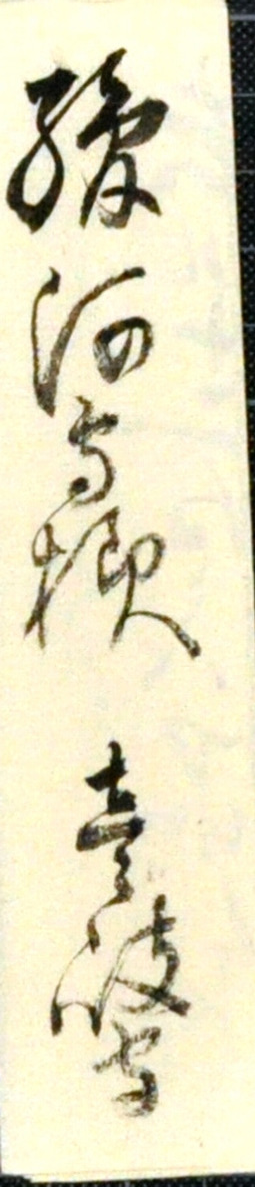駿河守様壱岐守

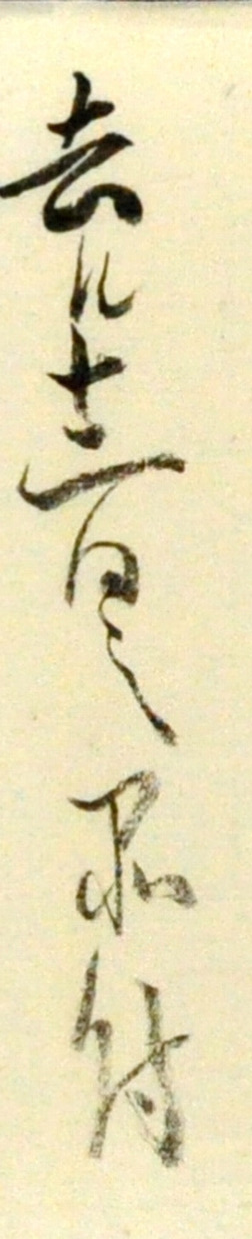去ル十二月之品付
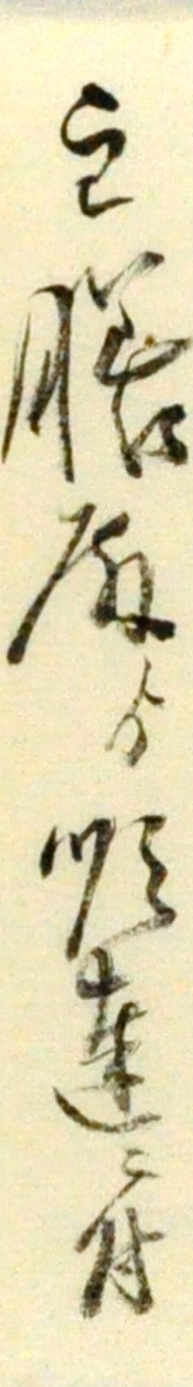主膳殿ゟ順達付
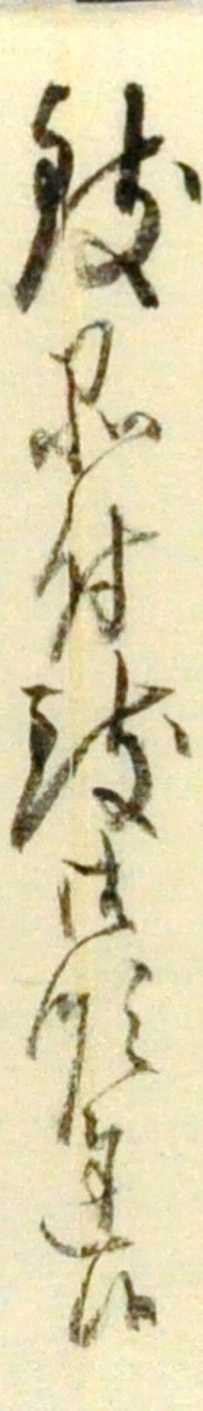致品付致御順達候
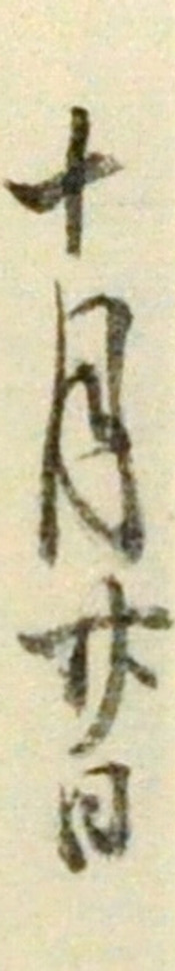十月廿日

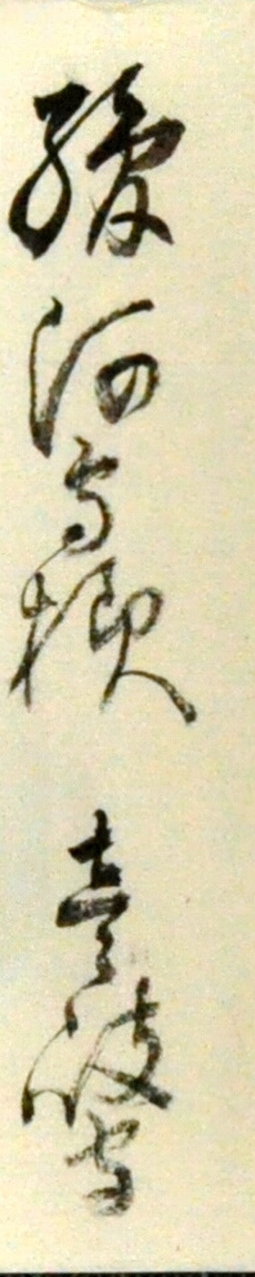駿河守様壱岐守
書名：若年寄御役中之御書物〔一括〕
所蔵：伊那市立高遠町図書館・合同会社AMANE
